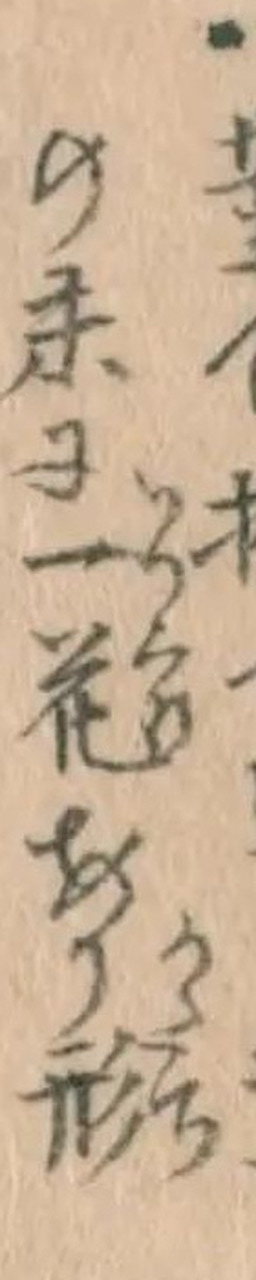の末に一花あり形
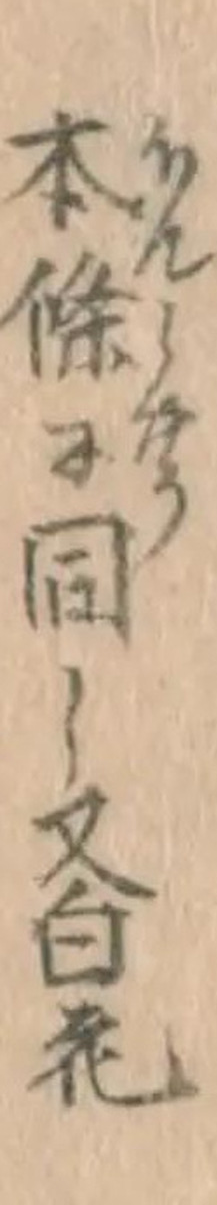本条に同し又白花
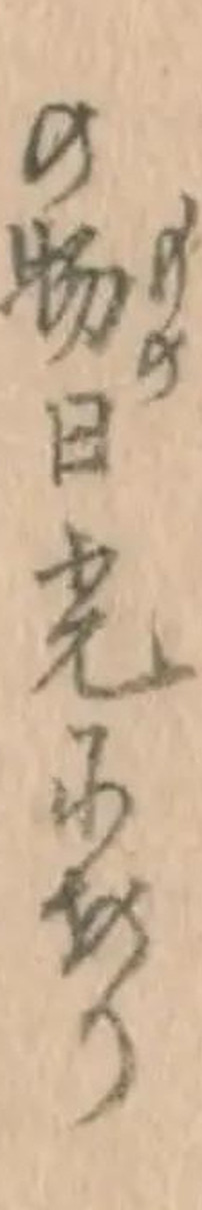の物日光にあり

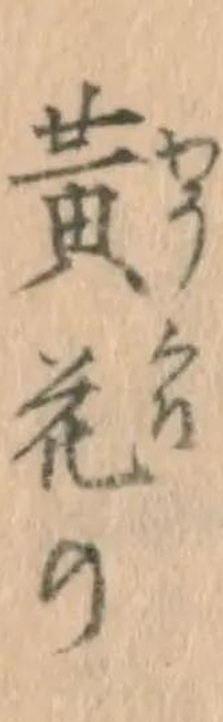黄花の
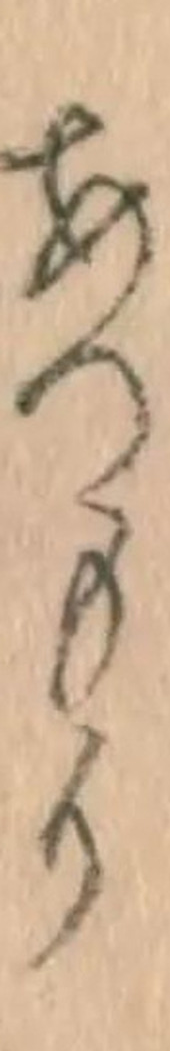あつもり

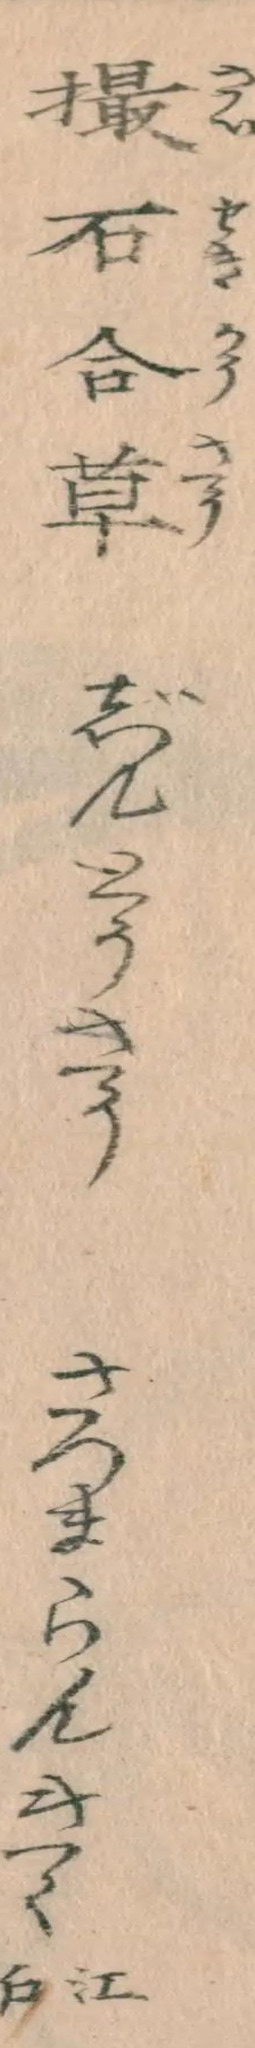撮石合草じんとうさうさつまらんきく江戸
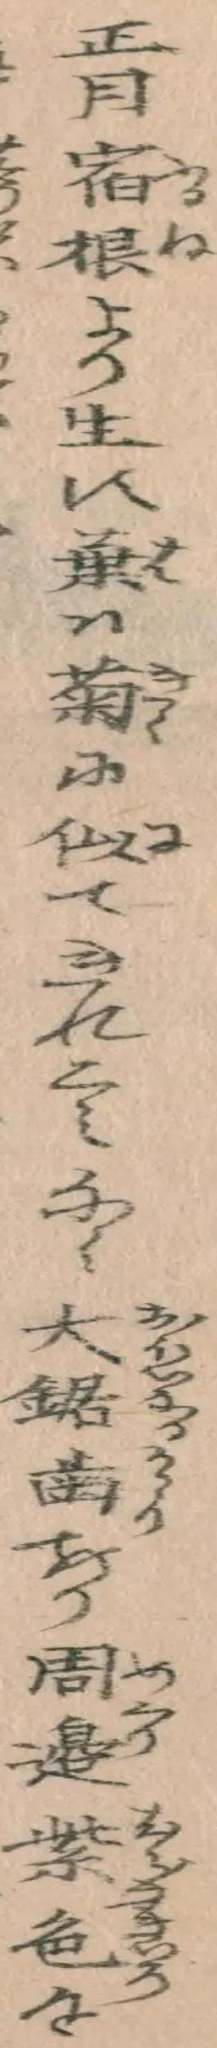正月宿根より生す葉は菊に似てきれこみなく大鋸歯あり周辺紫色を
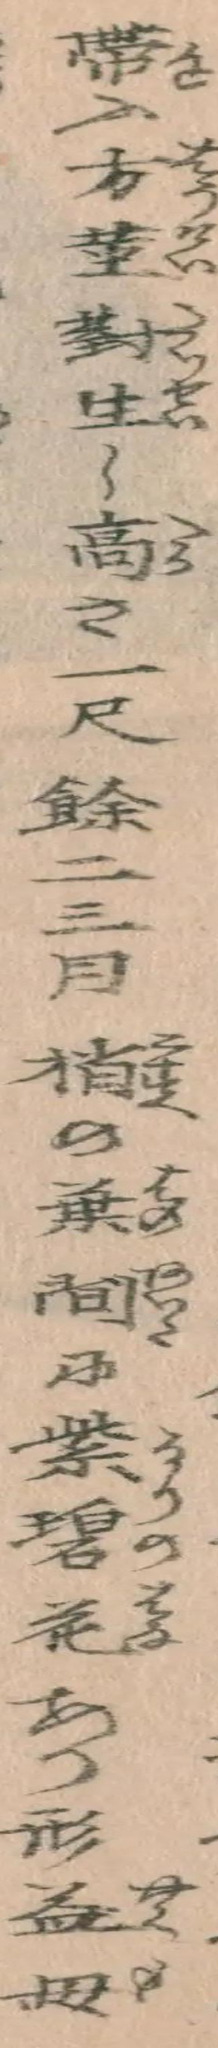帯ふ方茎対生し高さ一尺余二三月梢の葉間に紫碧花あり形益母
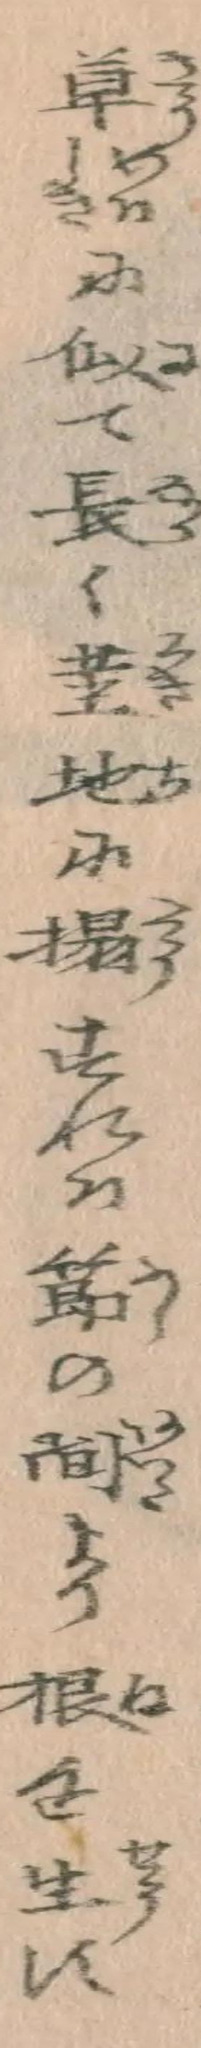草めはしきに似て長く茎地に搨すれは節の間より根を生す

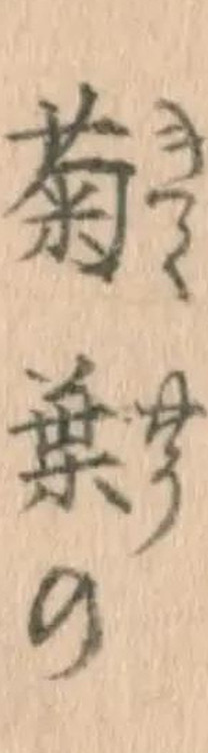菊葉の
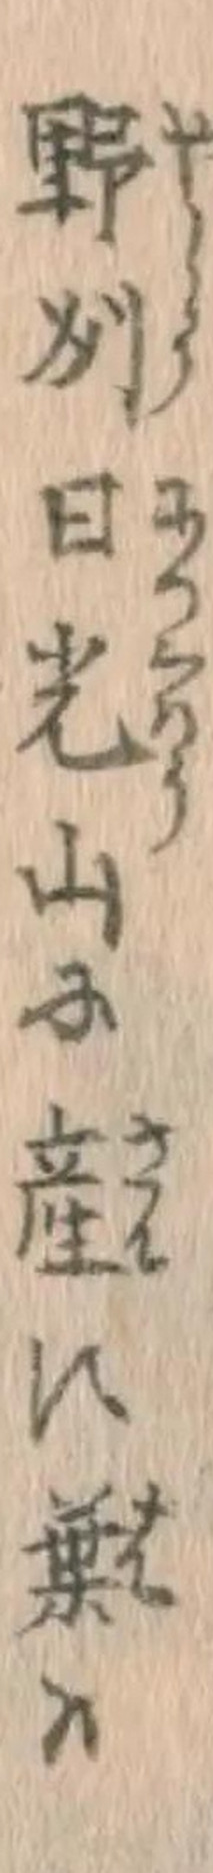野州日光山に産す葉は
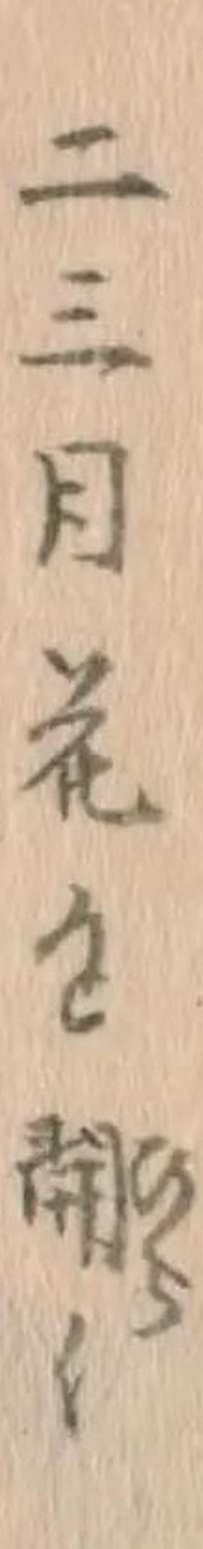二三月花を開く
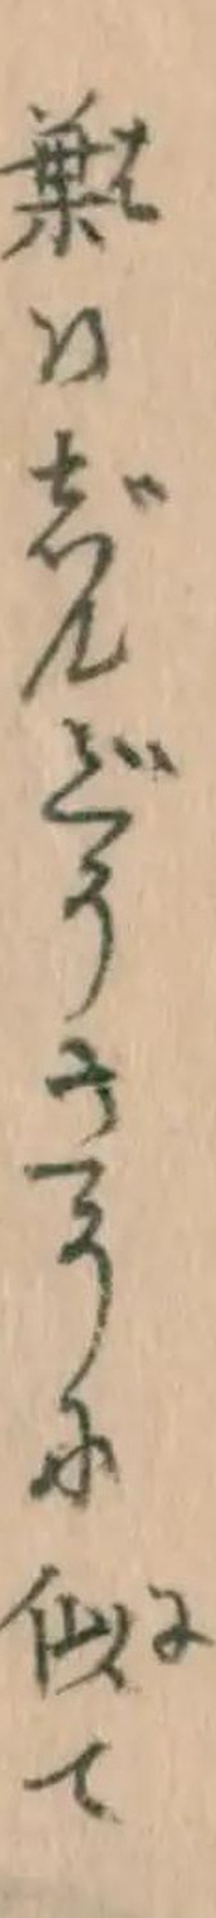葉はじんどうさうに似て
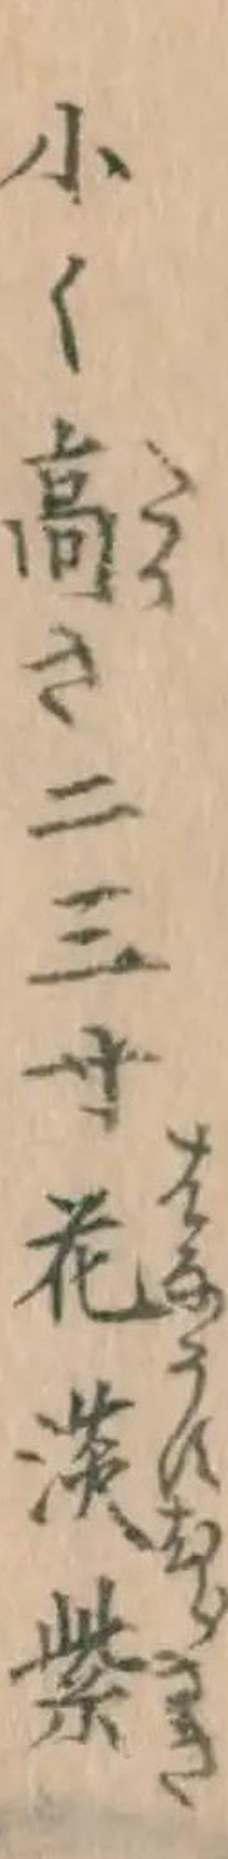小く高さ二三寸花淡紫
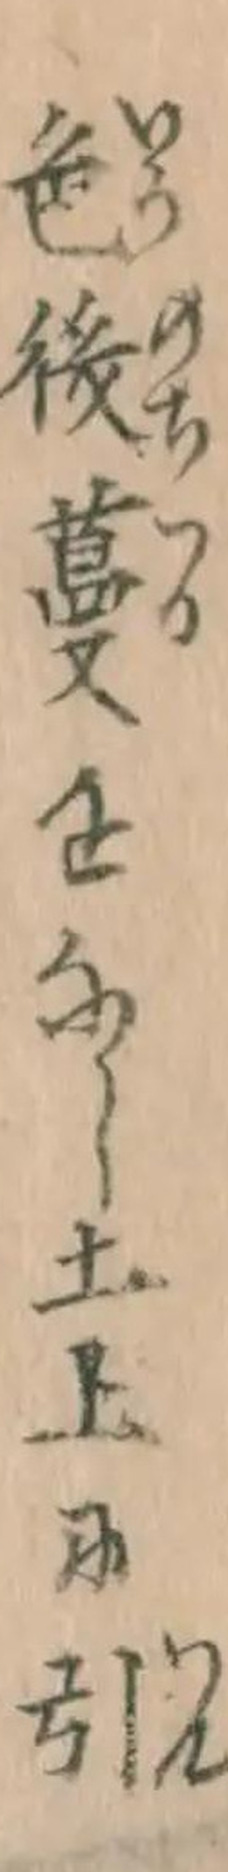色後蔓をなし土上に引
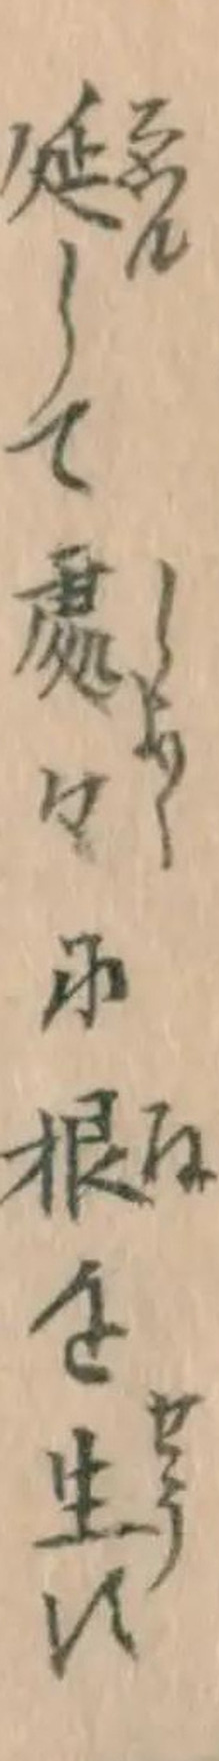延して処々に根を生す
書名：本草図譜. 巻37-39
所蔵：国立国会図書館 National Diet Library, JAPAN
